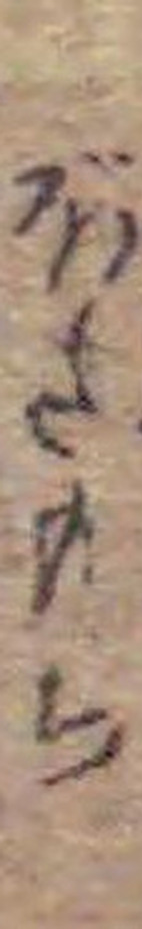ぼたもち
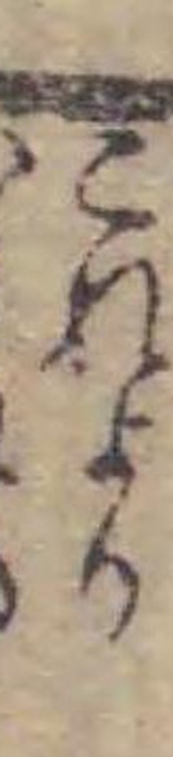これより
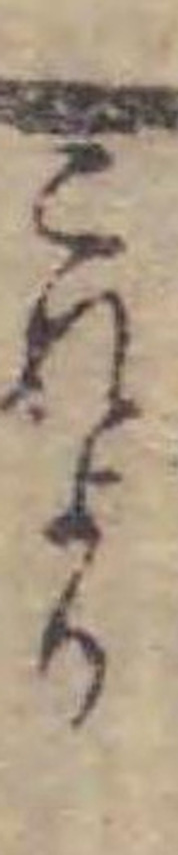これより
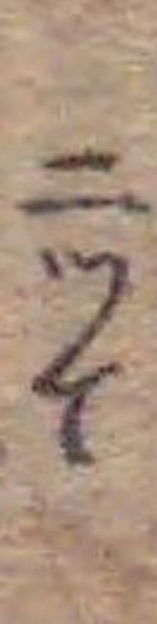二つて
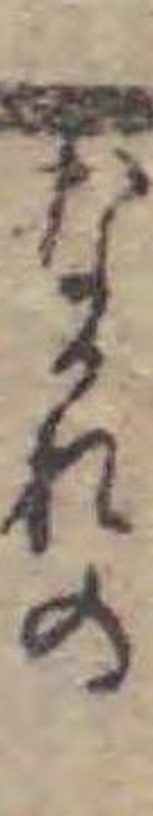なかれの
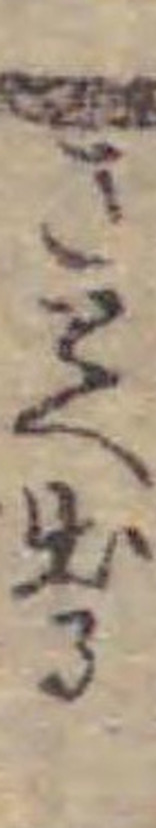さとへ出る
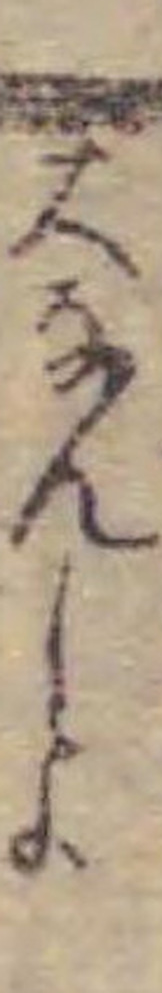大なんしよ
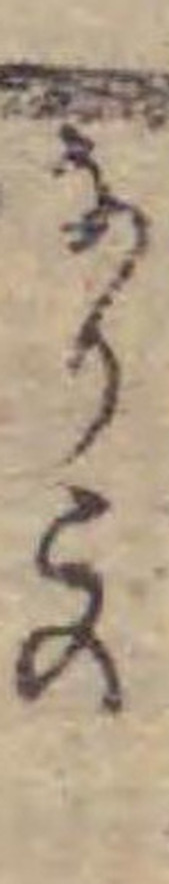なりこの
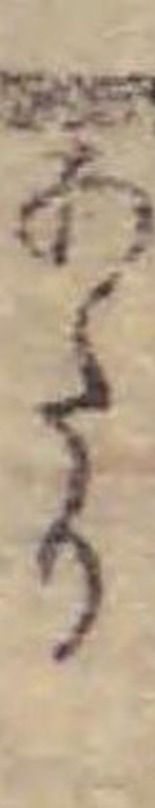あたり
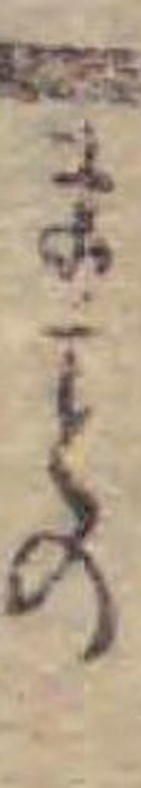まことの
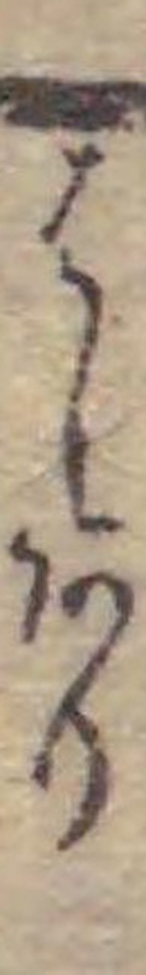はしあり
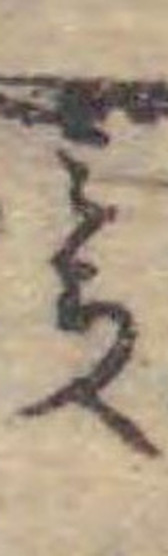みちへ
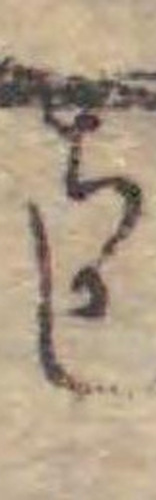ちかし

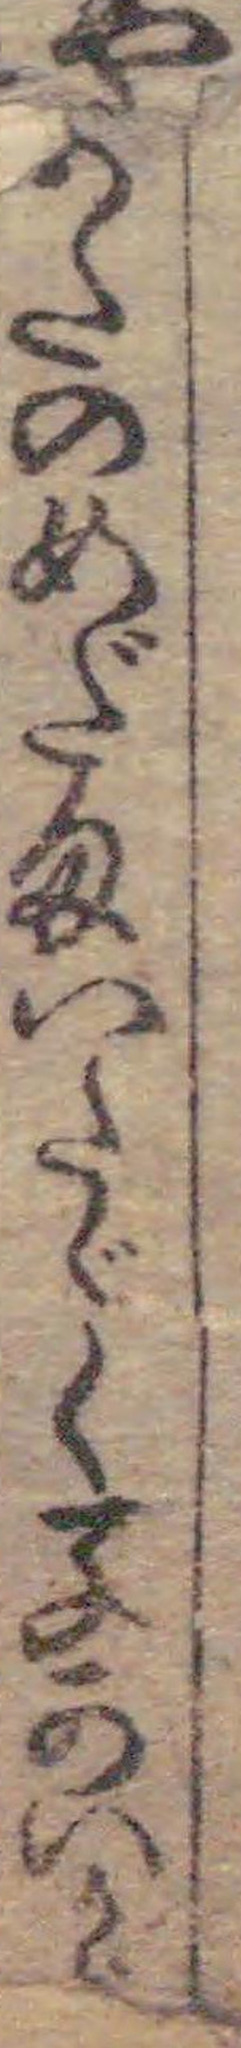おやかたのめだまいたゞく子かいから
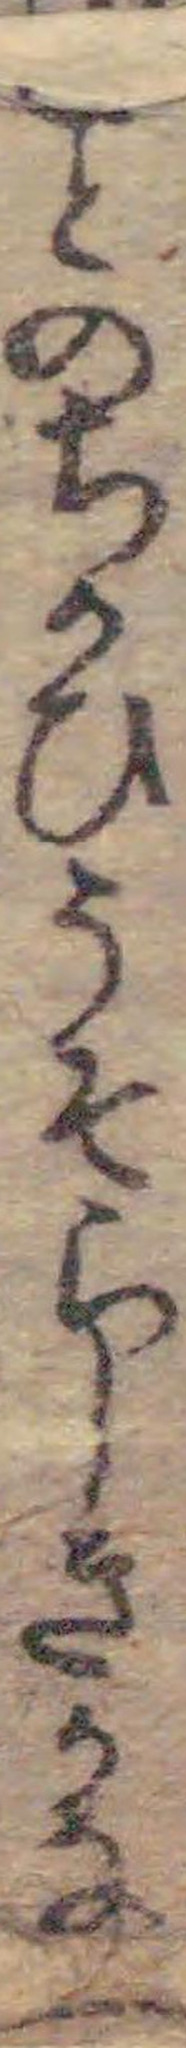手ごとのちかひうそらしきかな
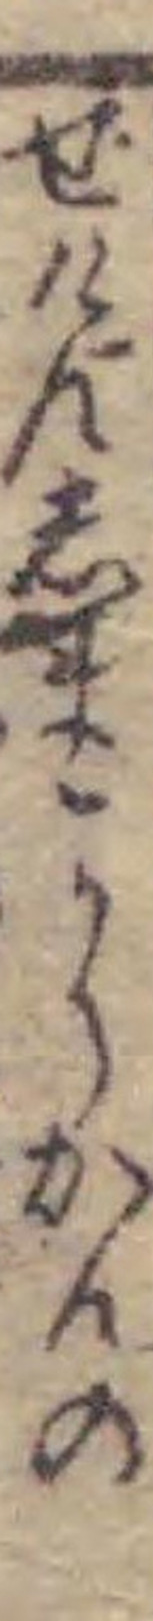ぜげんしまからかんの
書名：北国順礼唄方便 : 3巻
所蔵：国立国会図書館 National Diet Library, JAPAN
